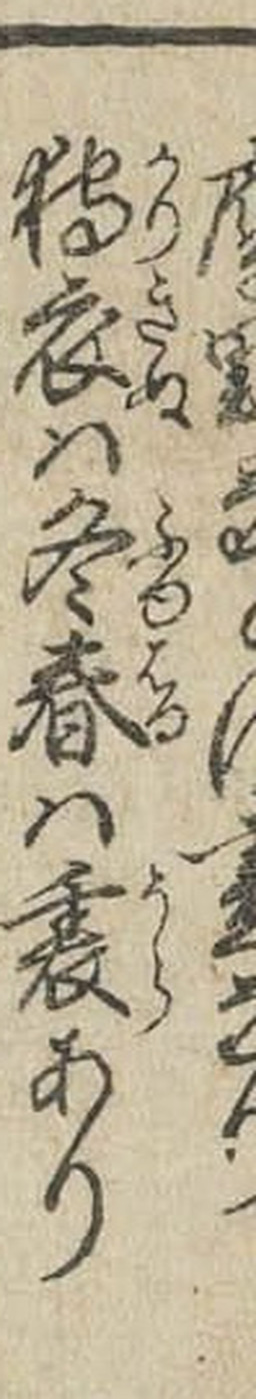狩衣は冬春は裏あり
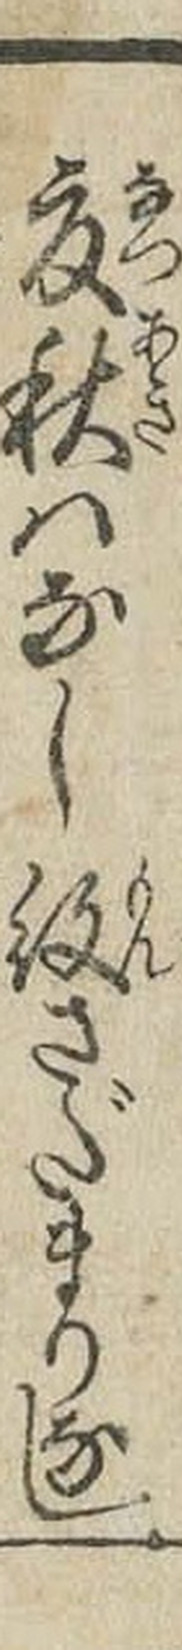夏秋はなし紋さだまりなし
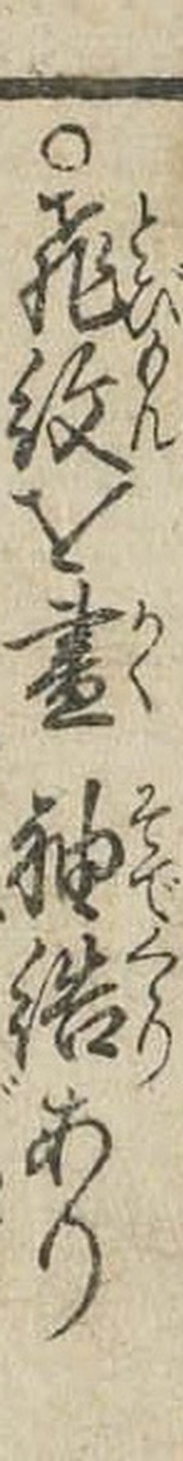○飛紋を畫袖結あり
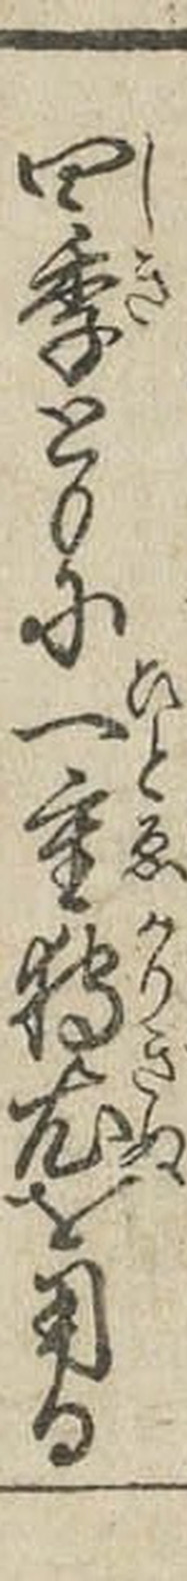四季ともに一重狩衣を用る
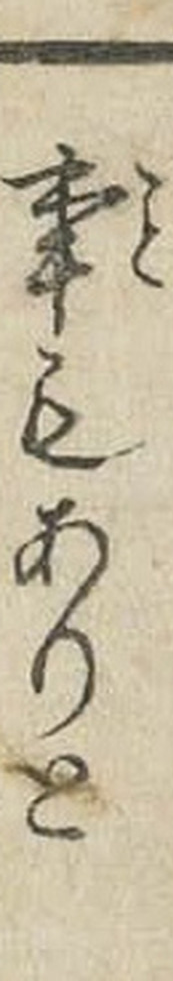事もありと
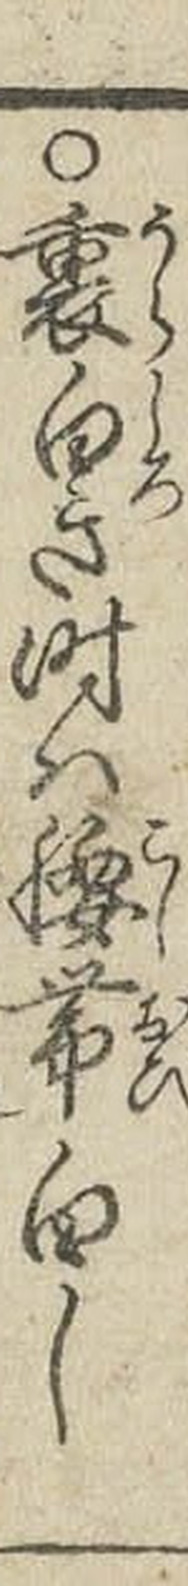○裏白き時は腰帯白し
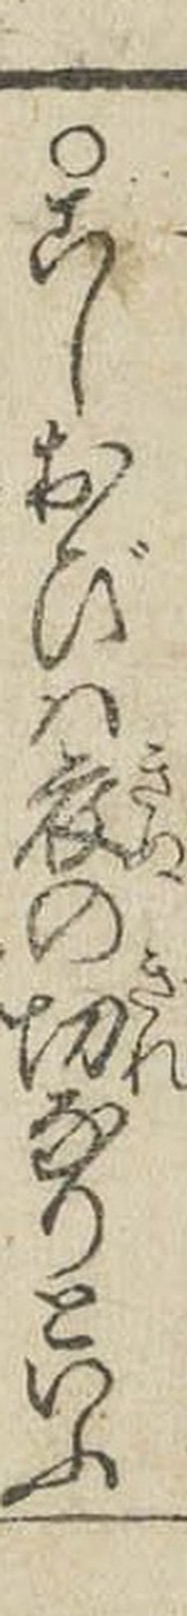○こしおびは衣の切なりといふ
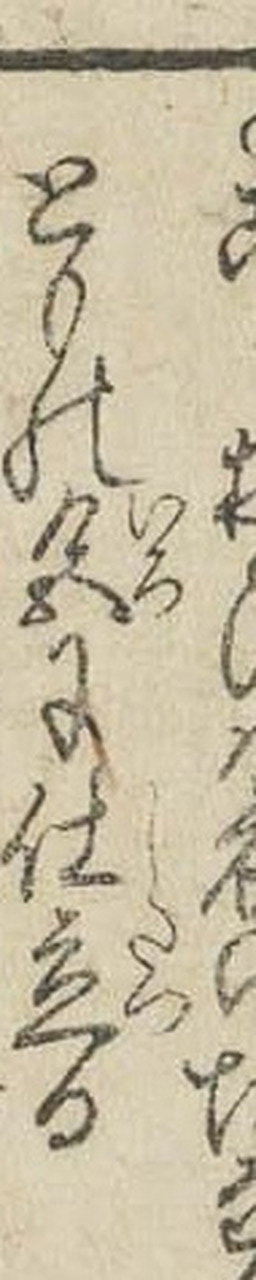ともの色に仕立る
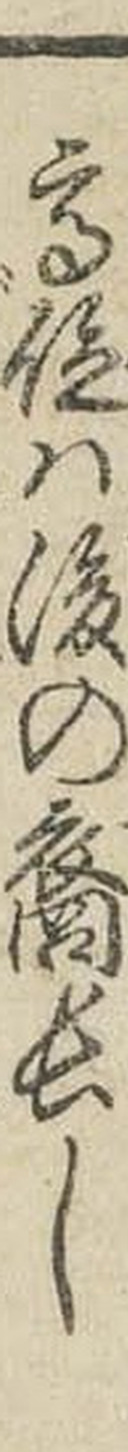高位は後の裔長し
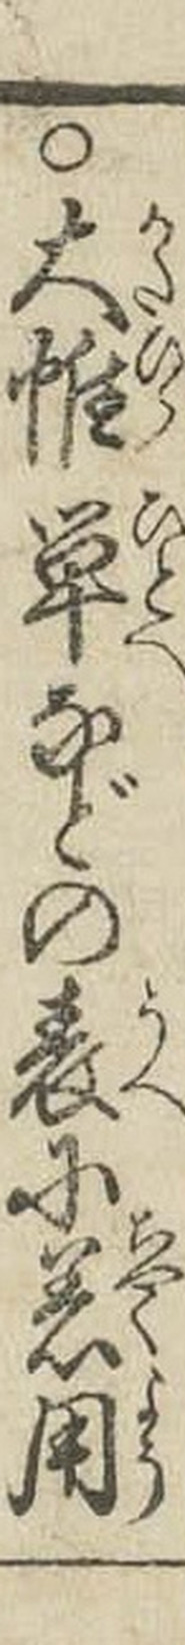○大帷単などの表に着用
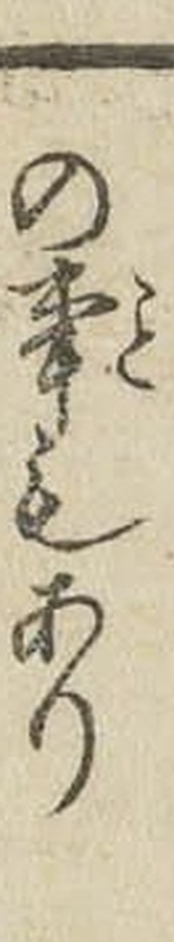の事もあり
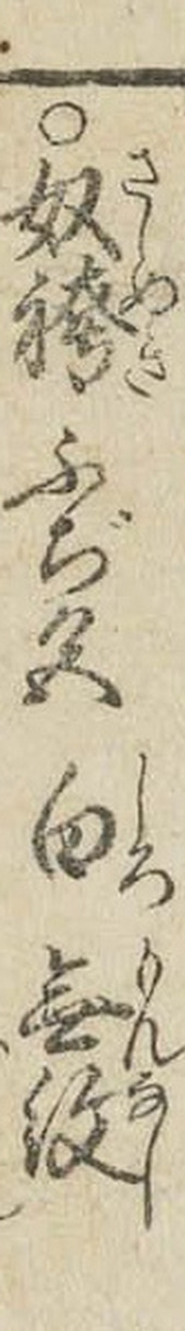○奴袴ふぢ色白無紋
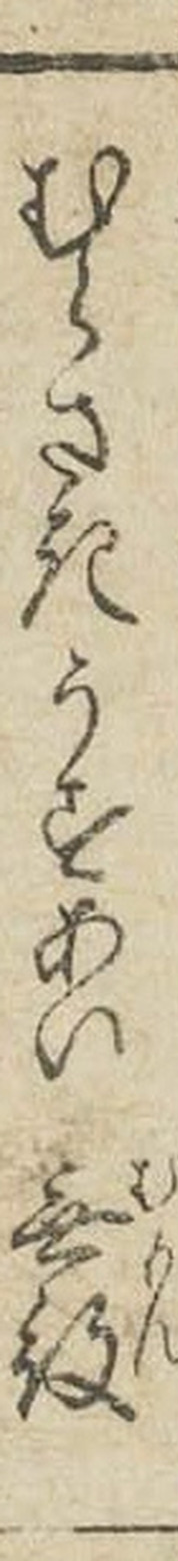むらさきうすあい無紋
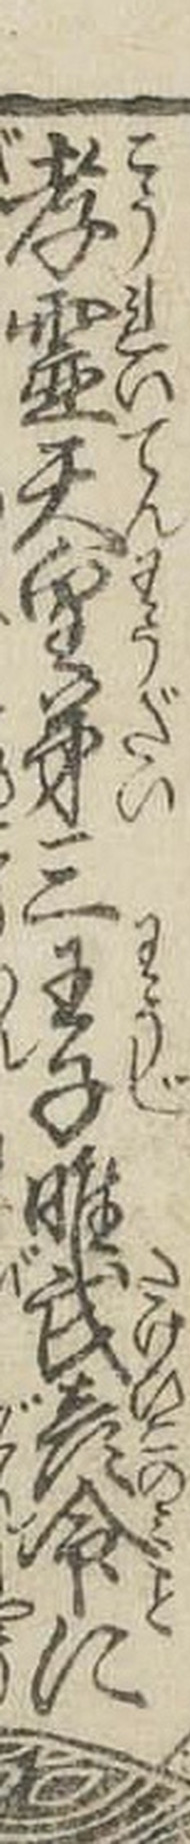孝霊天皇第三王子稚武彦命に
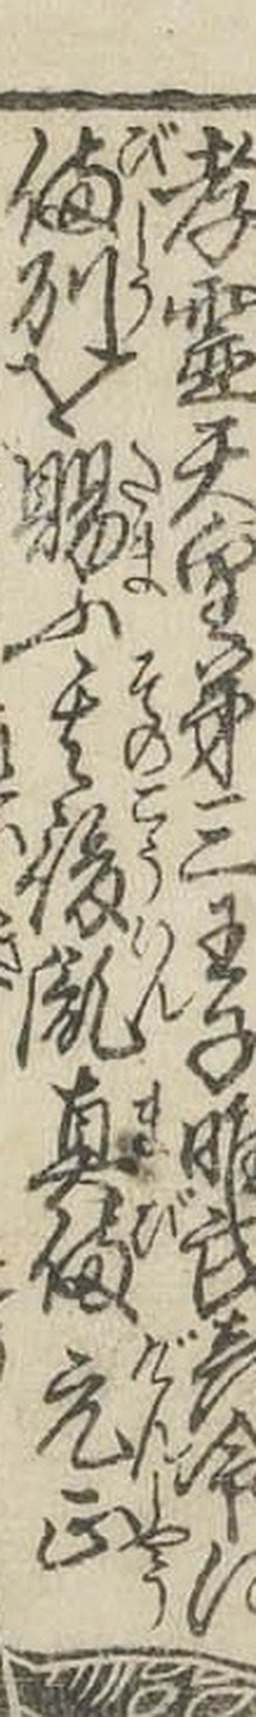備州を賜ふ其後胤真備元正
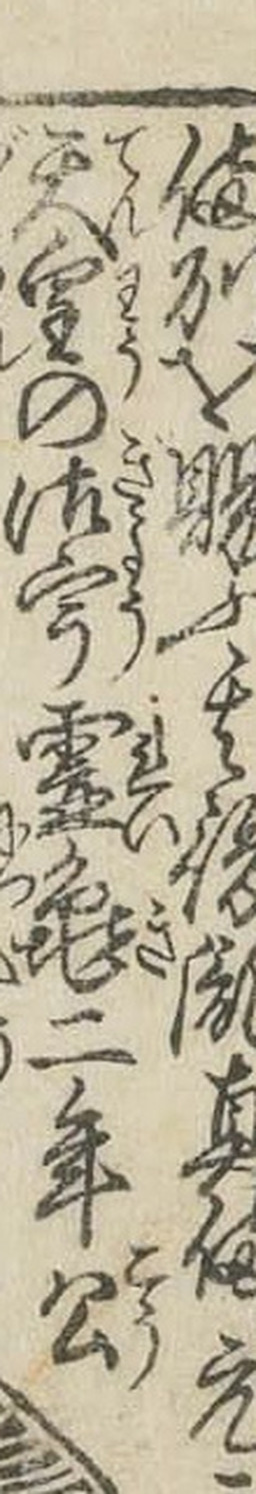天皇の御宇霊亀二年公
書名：絵本写宝袋 9巻 1之巻
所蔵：東京学芸大学教育コンテンツアーカイブ
